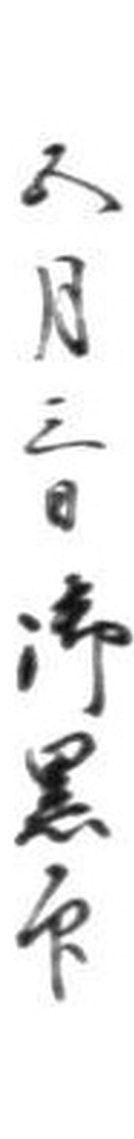五月三日御黒印
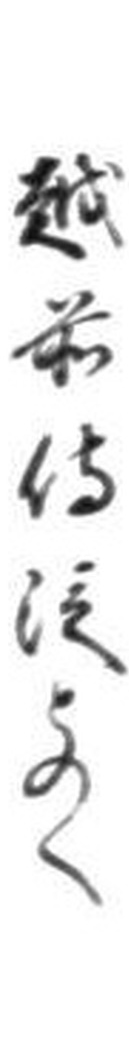越前侍従とのへ
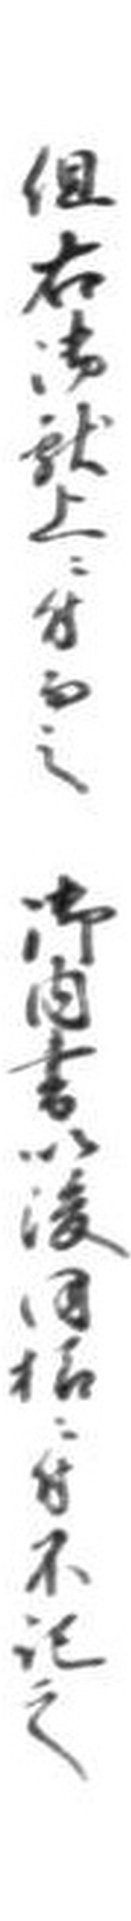但右御献上ニ付而之御内書以後同様ニ付不記之

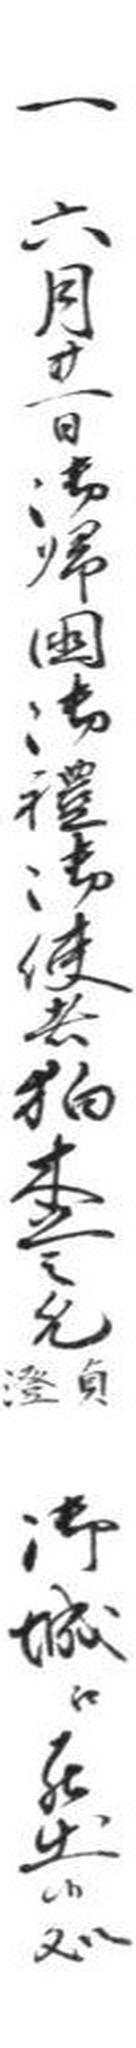一六月廿一日御帰国御礼御使者狛木工之允貞澄御城江罷出候処
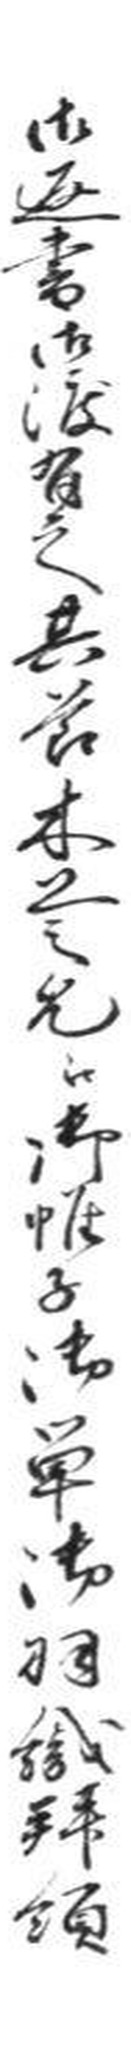御返書御渡有之其節木工之允江御帷子御単御羽織拝領
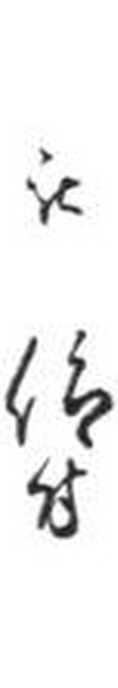被仰付
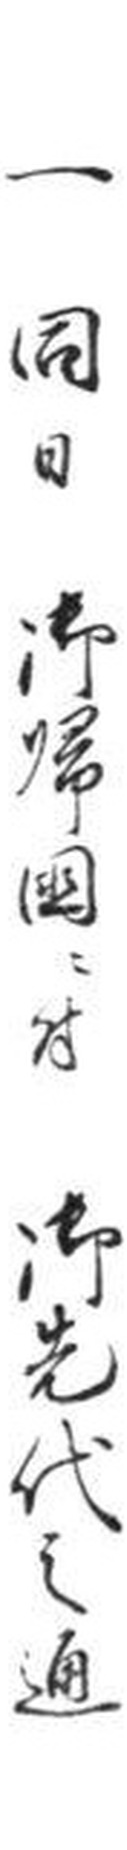一同日御帰国ニ付御先代之通
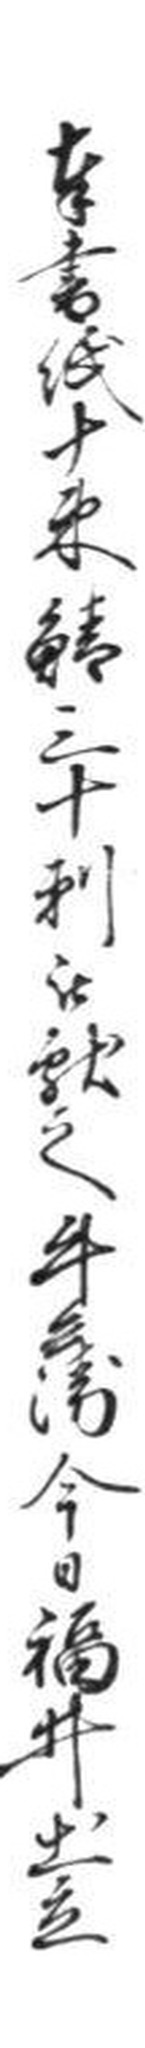奉書紙十束鯖三十刺被献之牛兵衛今日福井出立
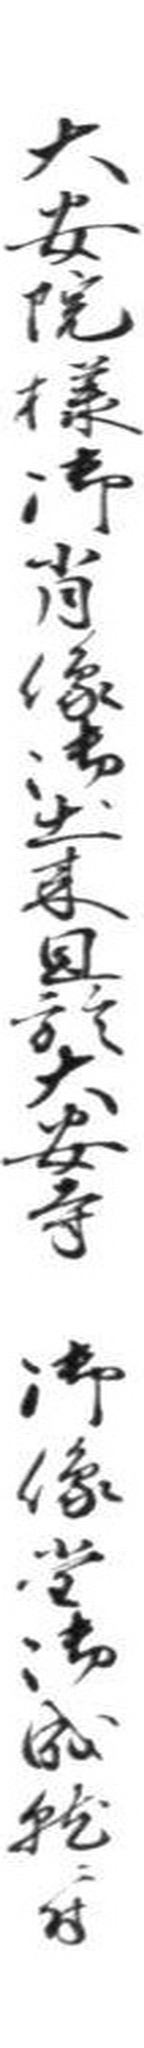大安院様御肖像御出来且於大安寺御像堂御成就ニ付
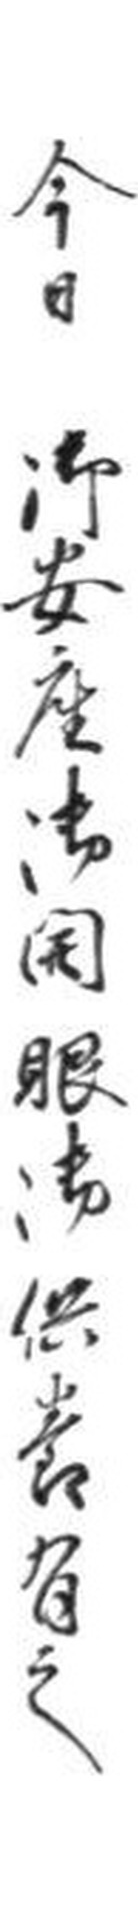今日御安産御開眼御供養有之
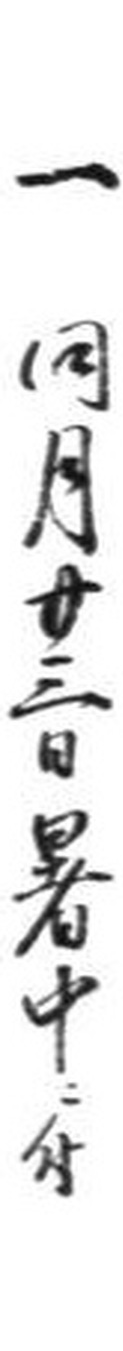一同月廿三日暑中ニ付
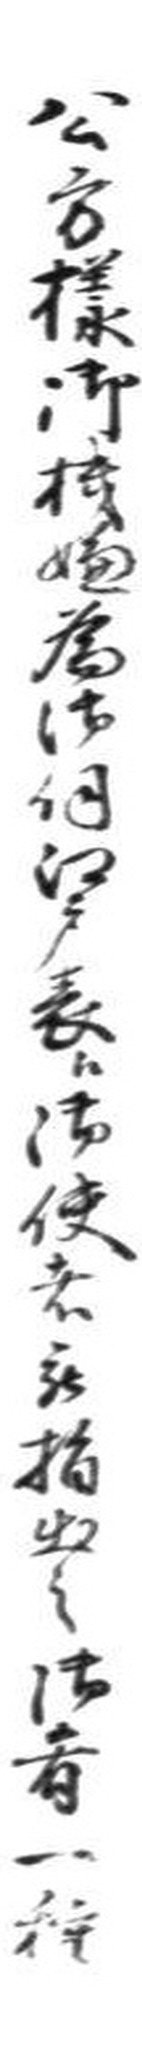公方様御機嫌為御伺江戸表江御使者被指出之御肴一種
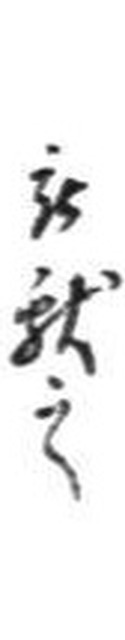被献之
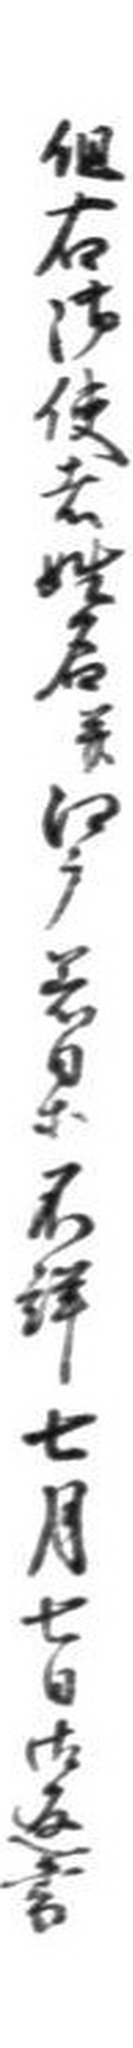但右御使者姓名并江戸着日等不詳七月七日御返書
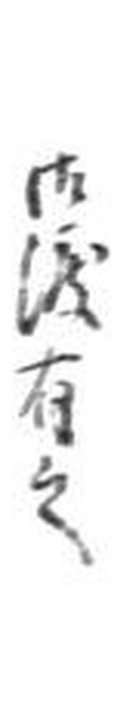御渡有之
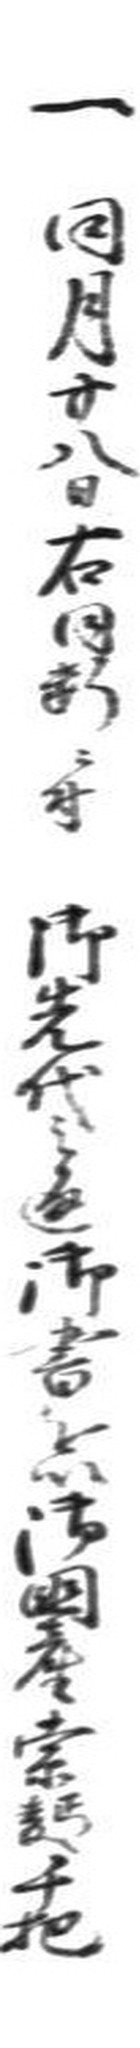一同月廿八日右同断ニ付御先代之通御書を以御国産索麺千把
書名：家譜 十三 綱昌公 従寛文元年到延宝五年
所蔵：福井県文書館 Fukui Prefectural Archives
